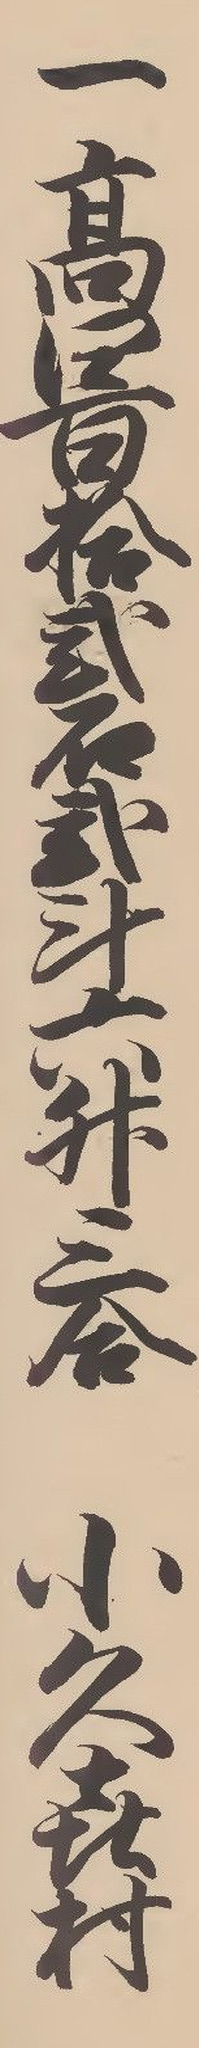一高四百拾弐石弐斗六升三合小久喜村
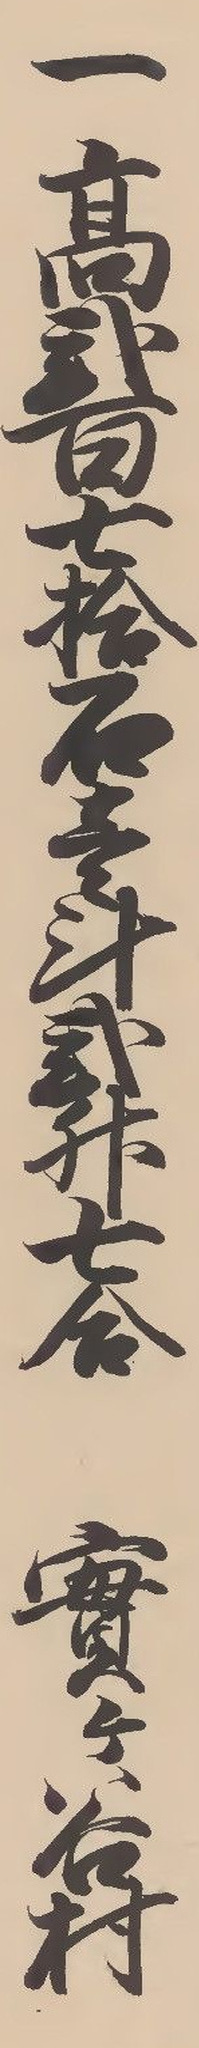一高弐百七拾石壱斗弐升七合実ヶ谷村
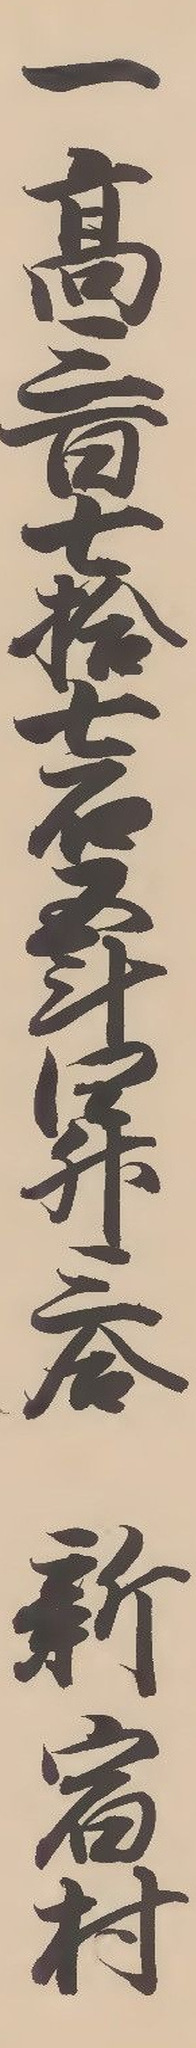一高三百七拾七石五斗四升三合新宿村
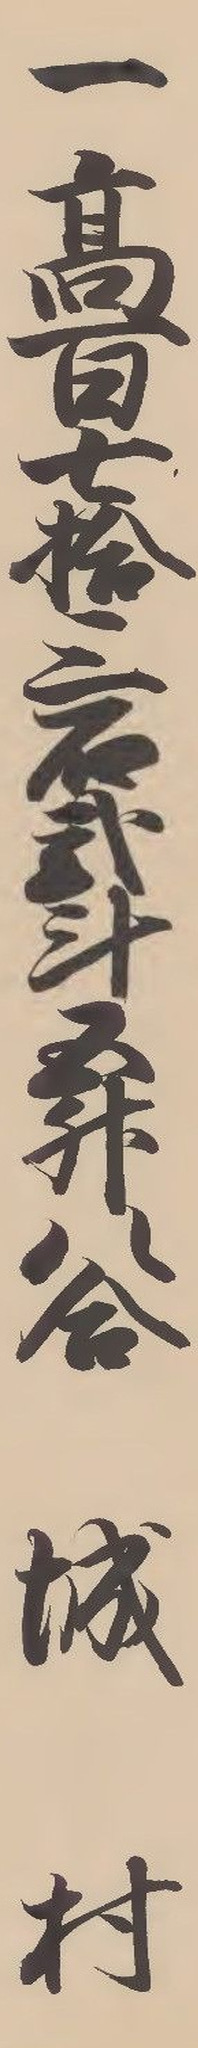一高百七拾三石弐斗五升八合城村
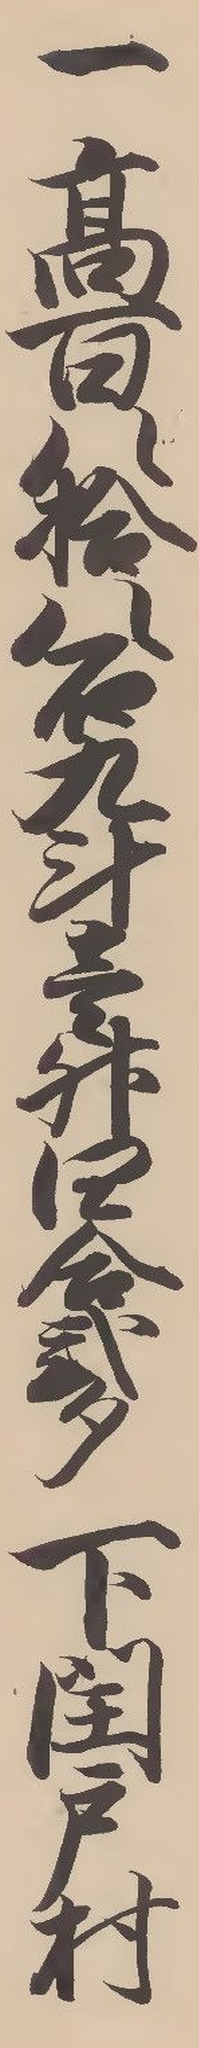一高百八拾八石九斗壱升四合弐勺下閏戸村

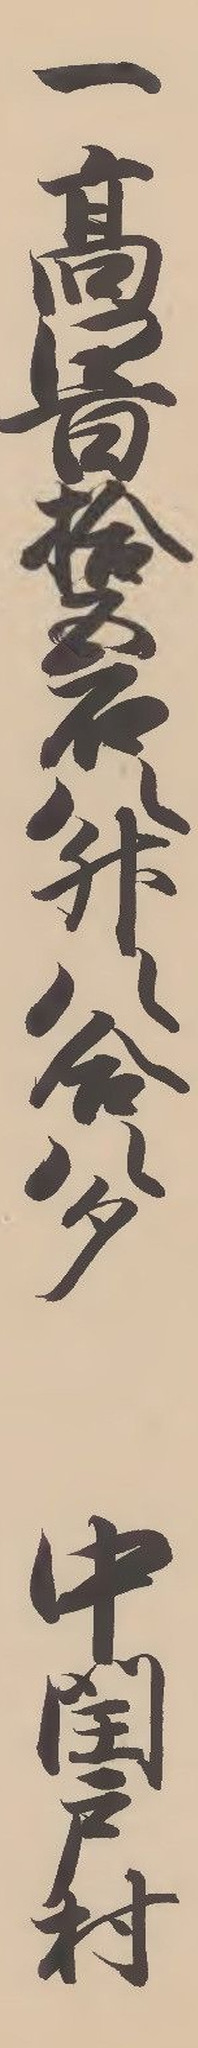一高四百拾五石八升八合八勺中閏戸村
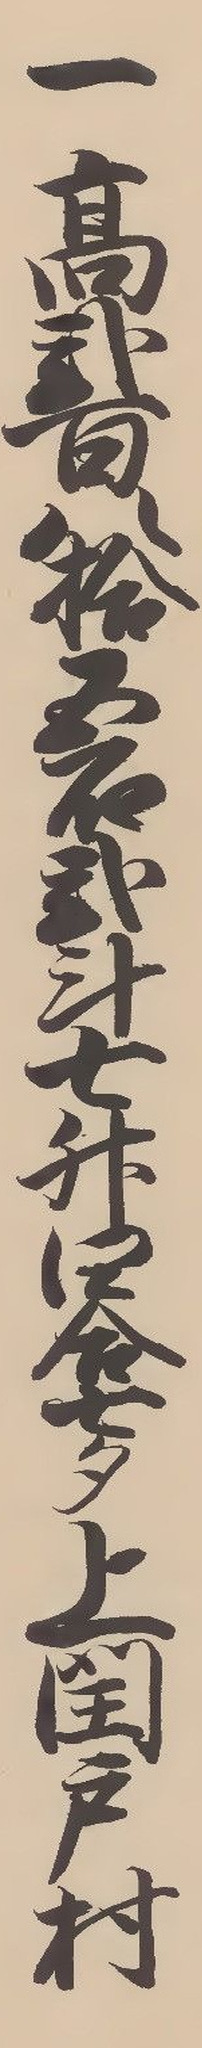一高弐百八拾五石弐斗七升四合七勺上閏戸村
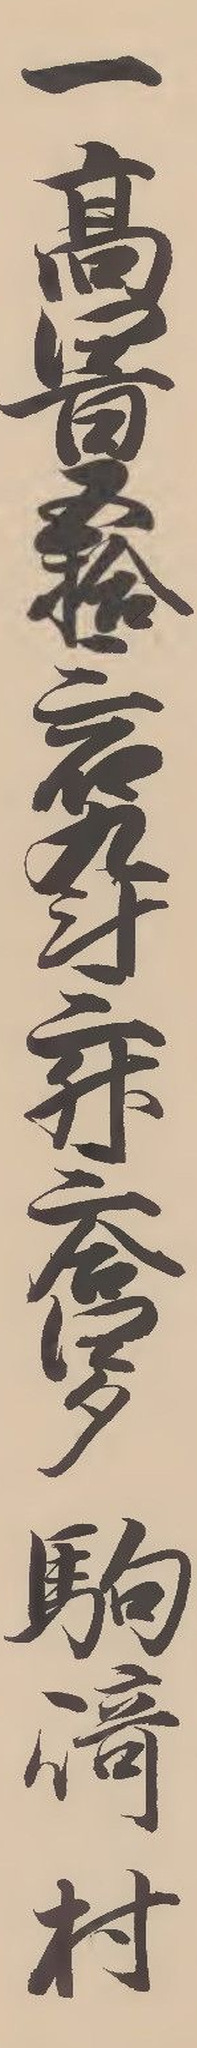一高四百五拾三石九斗三合四勺駒崎村
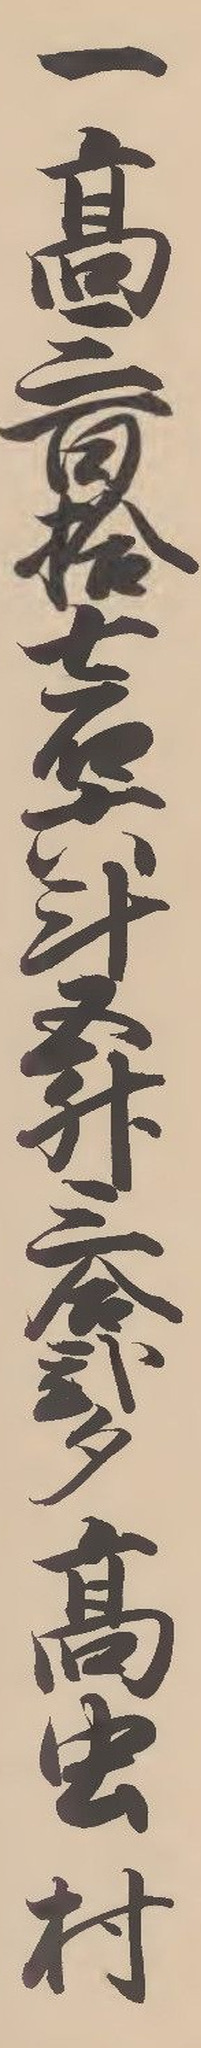一高三百拾七石六斗五升三合弐勺高虫村
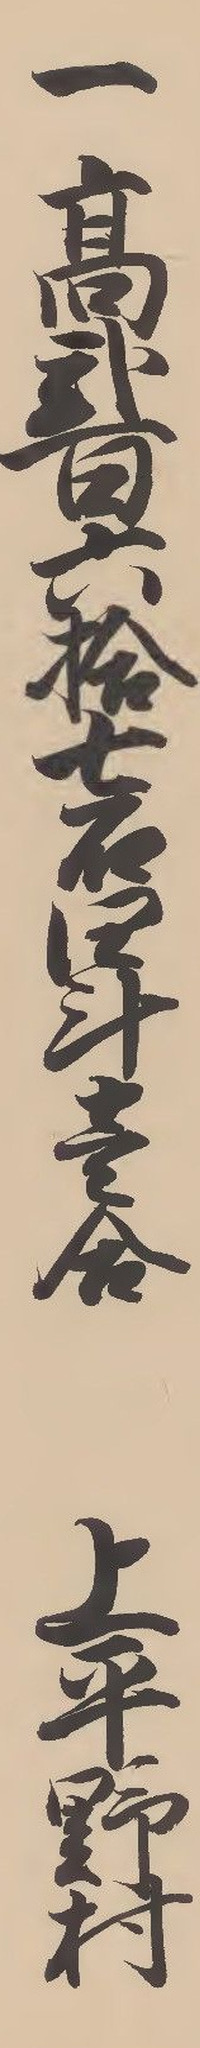一高弐百六拾七石四斗壱合上平野村
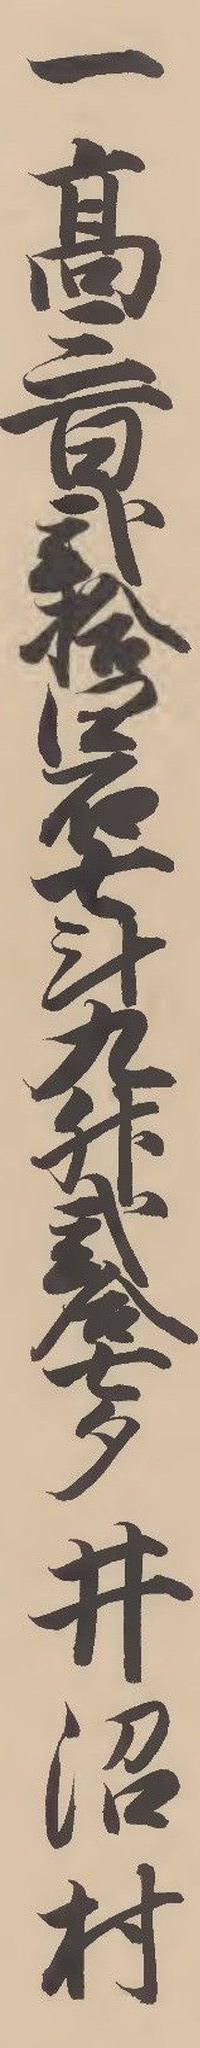一高三百弐拾四石七斗九升弐合七勺井沼村
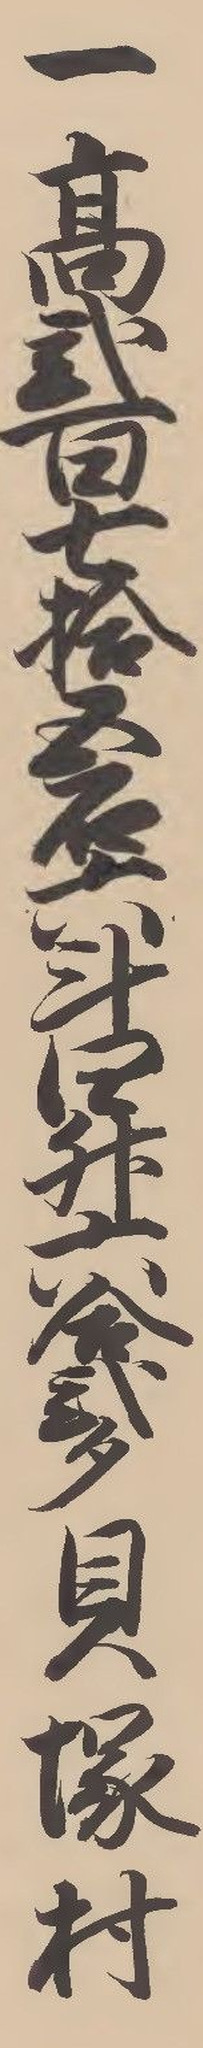一高弐百七拾五石六斗四升六合弐勺貝塚村
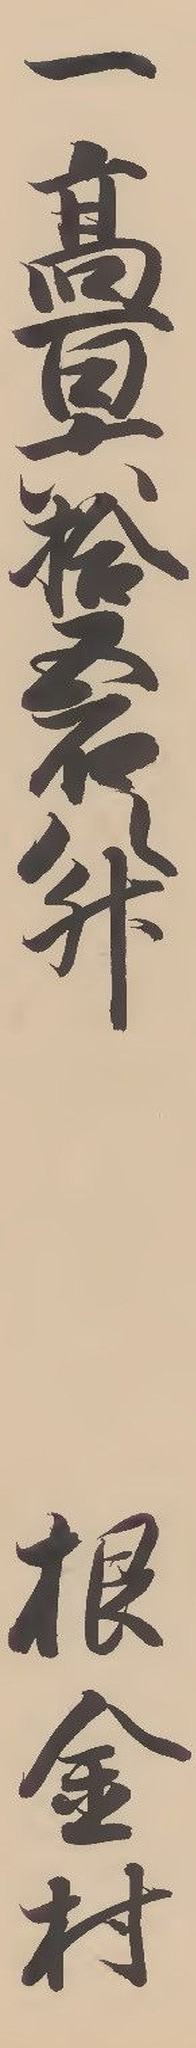一高百六拾五石八升根金村

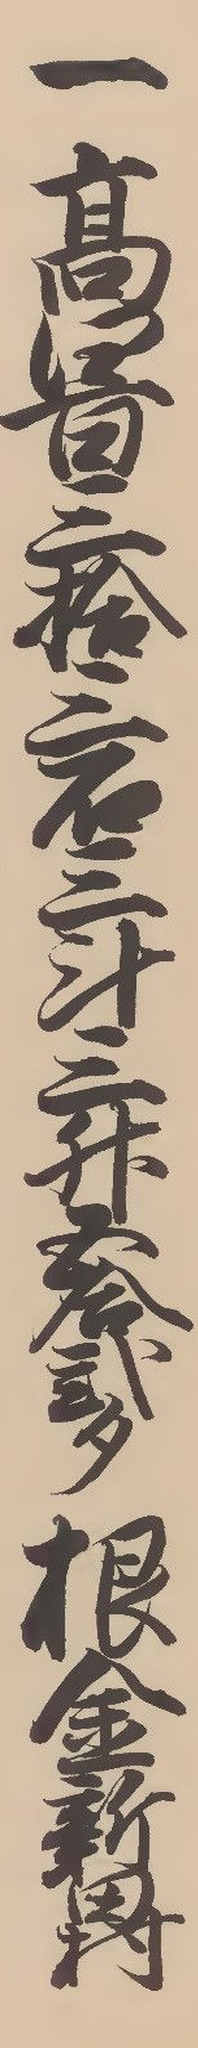一高四百三拾三石三斗三升五合弐勺根金新田村
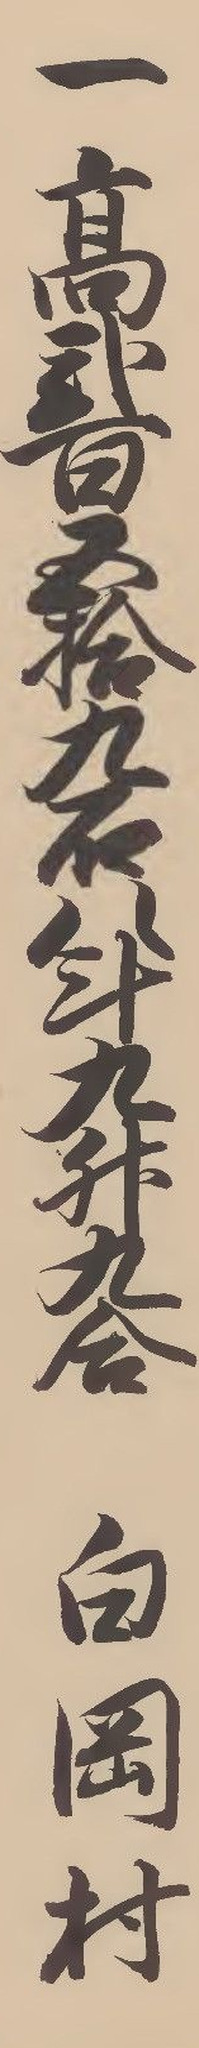一高弐百五拾九石八斗九升九合白岡村
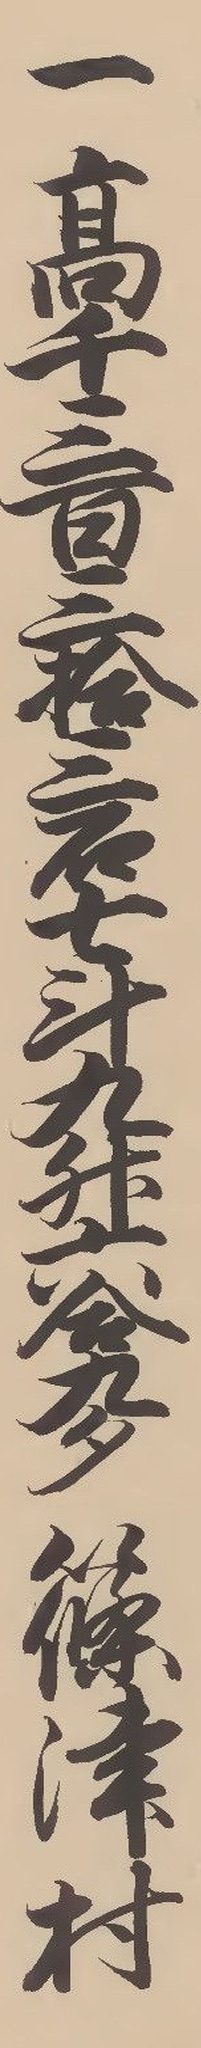一高千三百三拾三石七斗九升六合九勺篠津村
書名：武蔵国郷帳　下
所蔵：国立公文書館 National Archives of Japan
